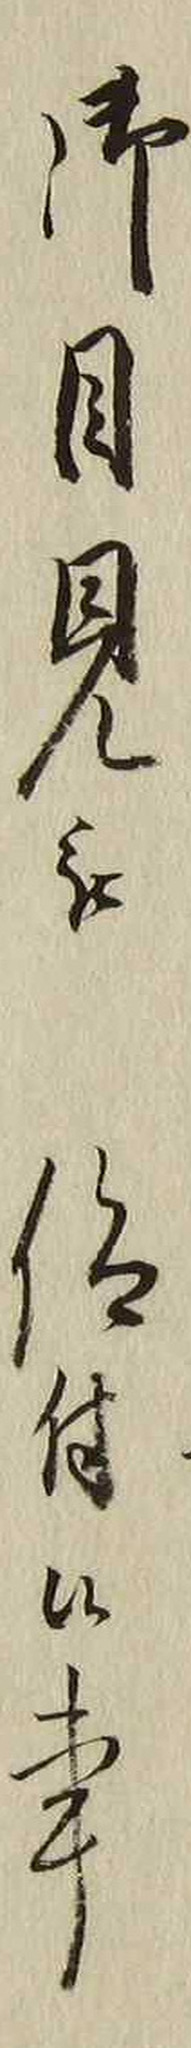御目見被仰付候事
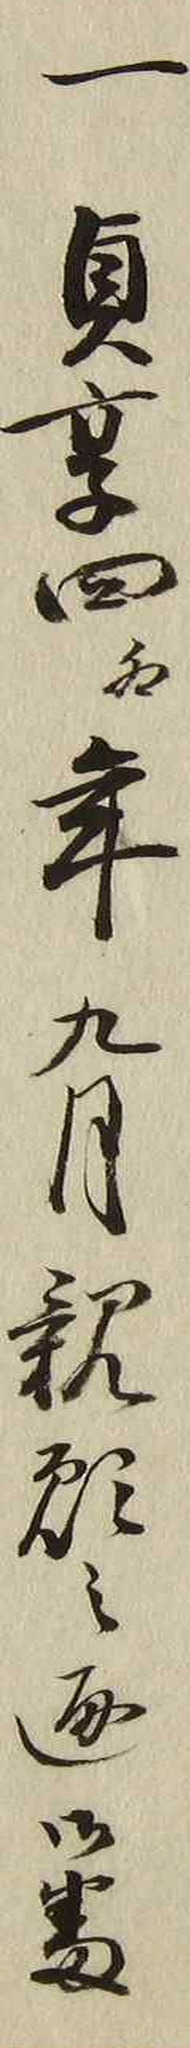一貞享四卯年九月親願之通御番
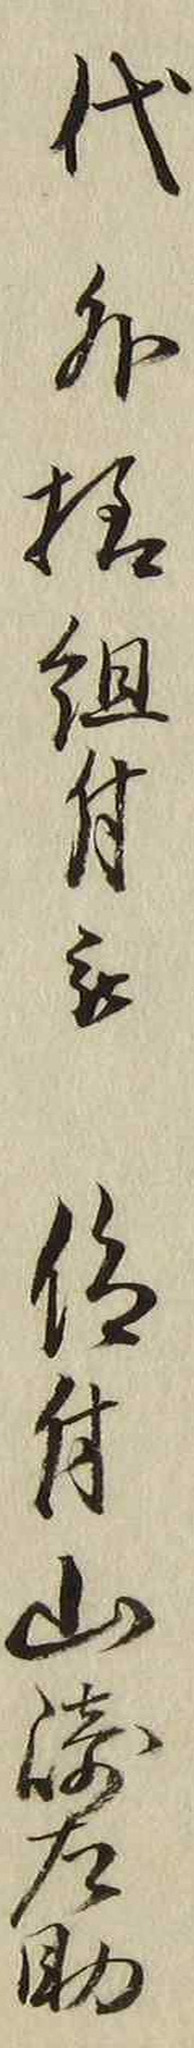代外様組付被仰付山崎左助
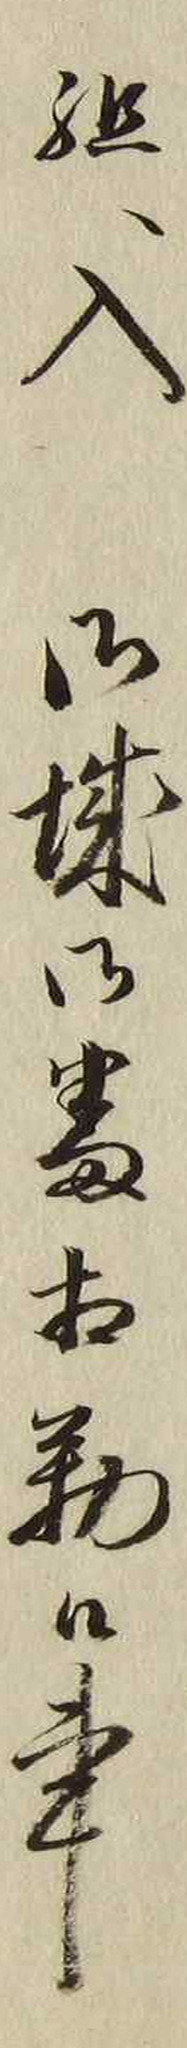組へ入御城御番相勤候事
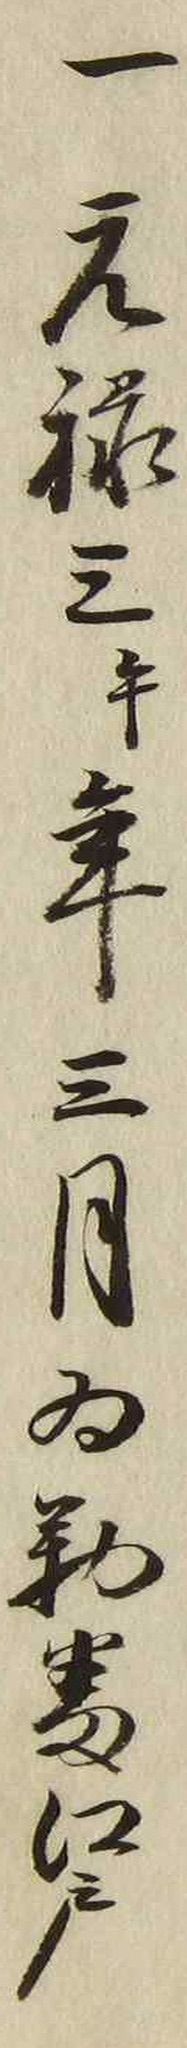一元禄三午年三月為勤番江戸
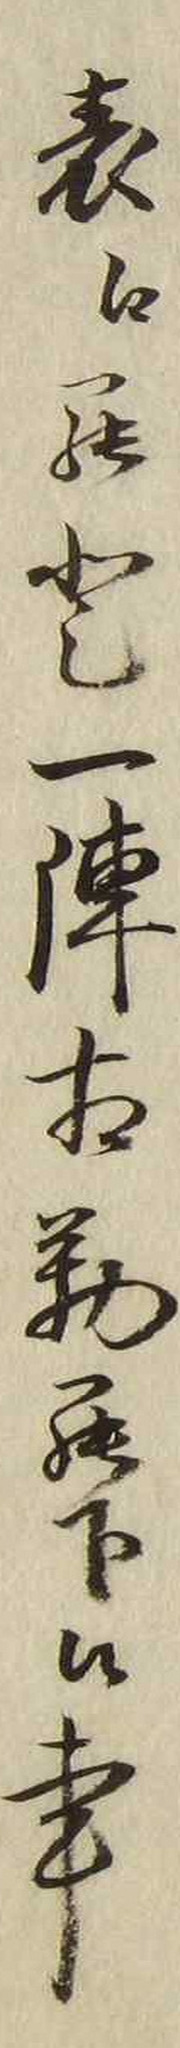表江罷登一陣相勤罷下候事

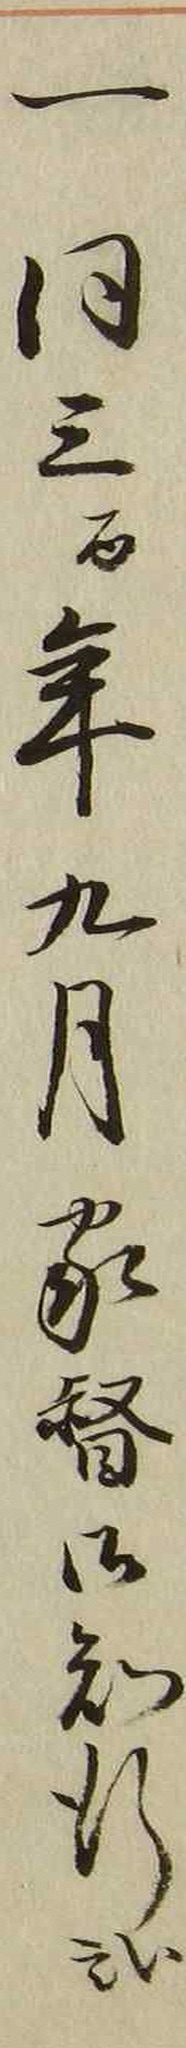一同三酉年九月家督御知行弐
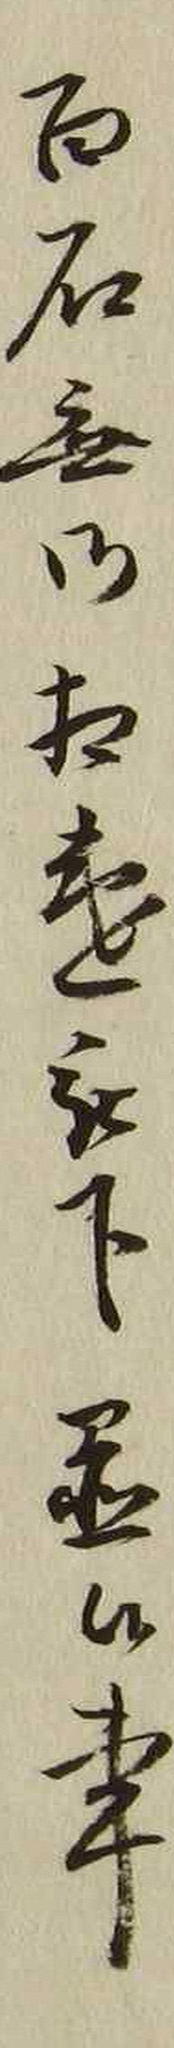百石無御相違被下置候事
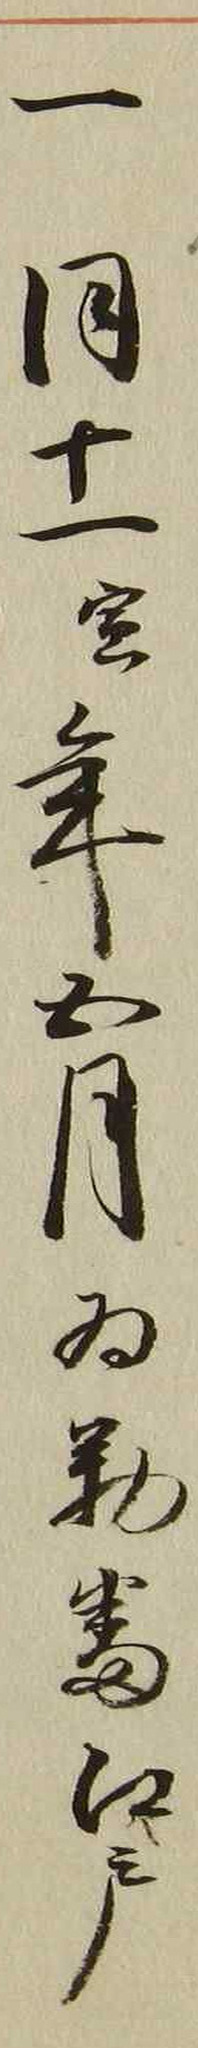一同十一寅年五月為勤番江戸
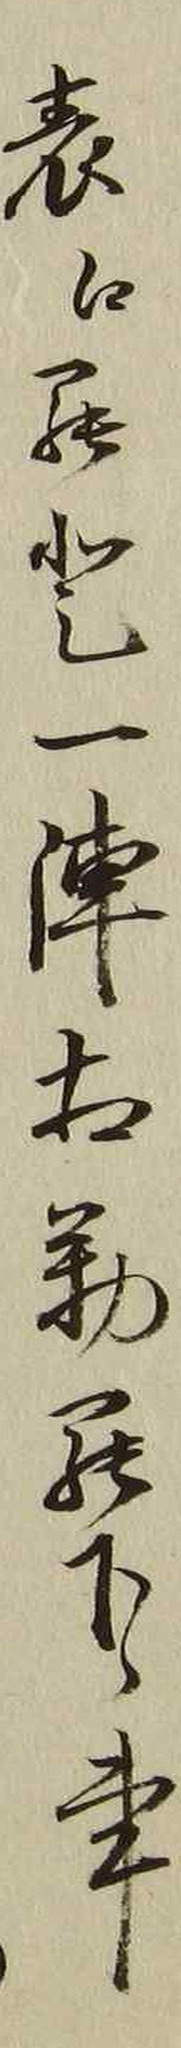表江罷登一陣相勤罷下候事
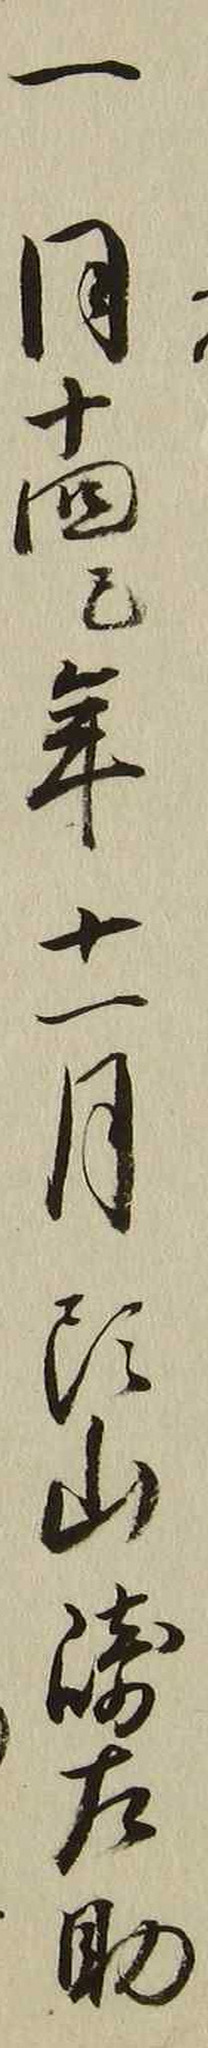一同十四巳年十一月頭山崎左助
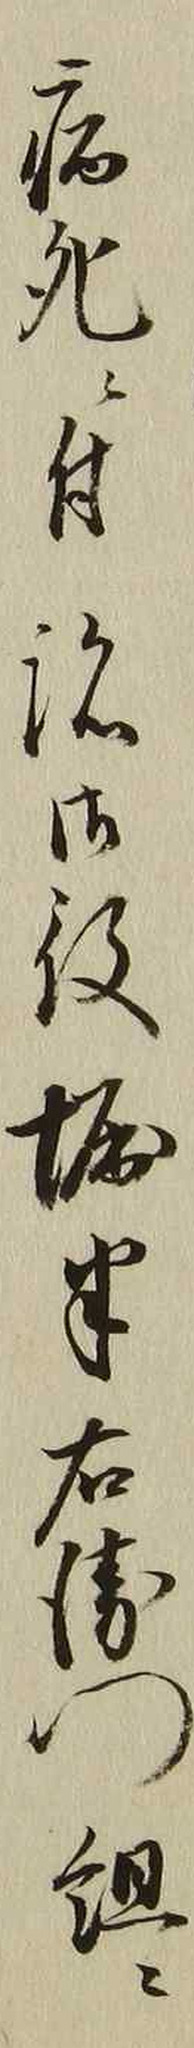病死ニ付跡御役堀半右衛門組ニ
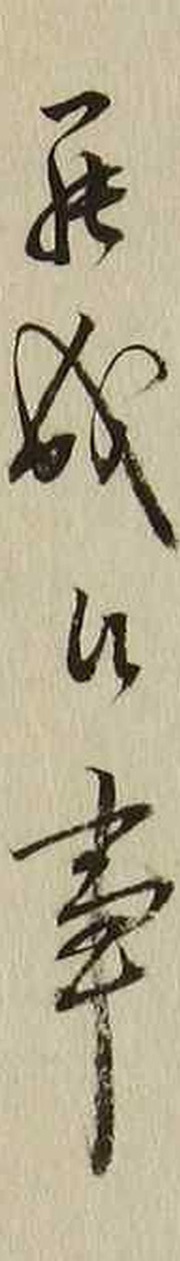罷成候事
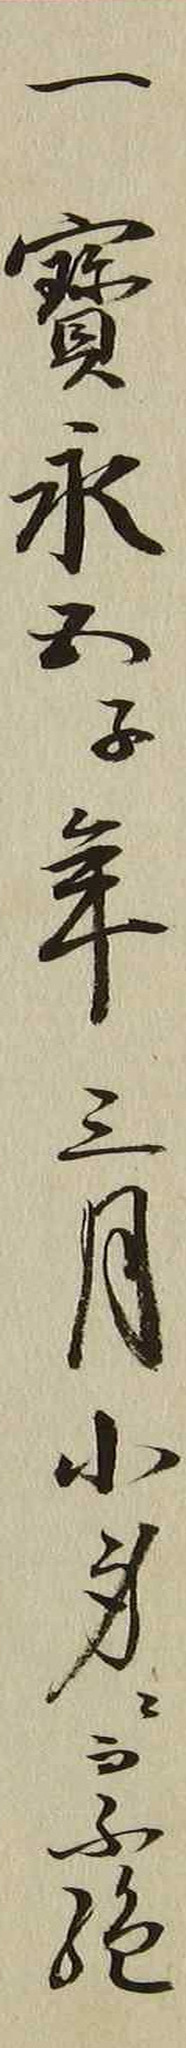一宝永五子年三月小身ニ而不絶
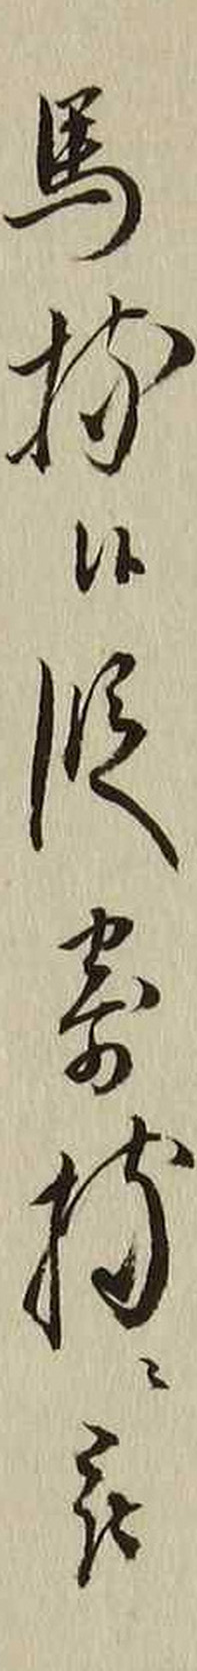馬持候段寄特ニ被
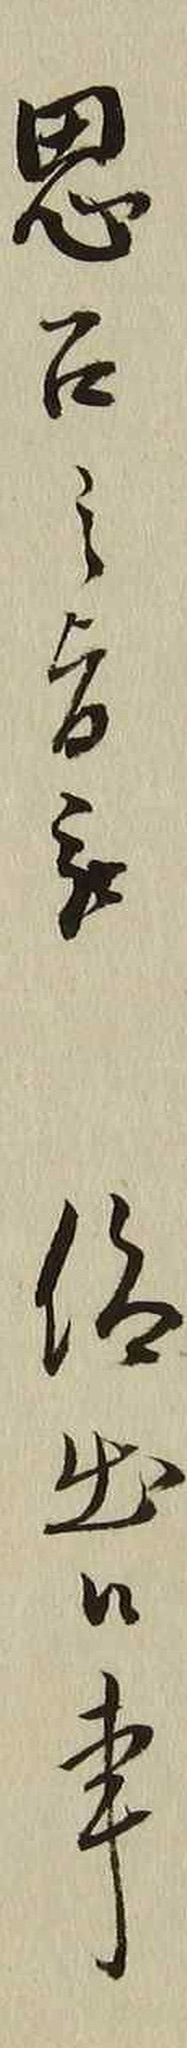思召之旨被仰出候事
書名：諸士系譜　巻之69　を之部3
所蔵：会津若松市立会津図書館
